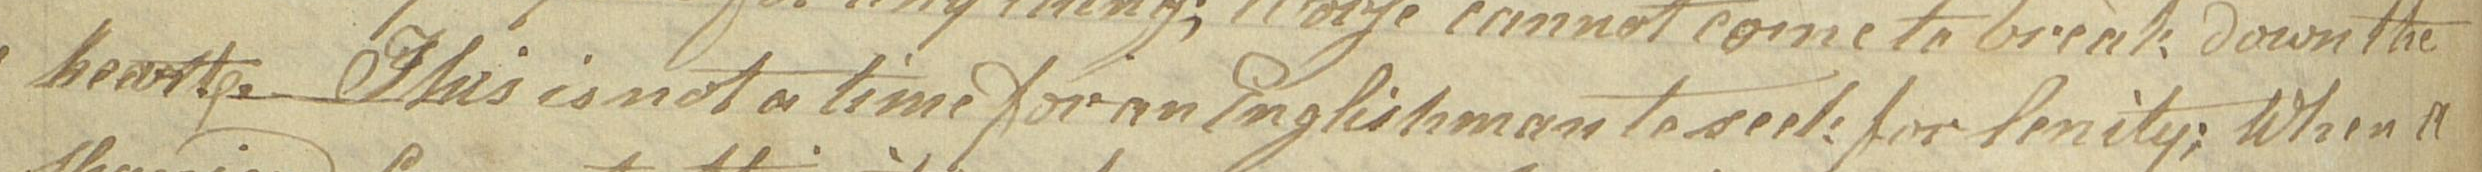heart. This is not a time for an Englishman to seek for lenity; When a
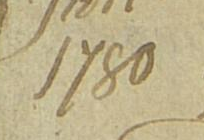1780
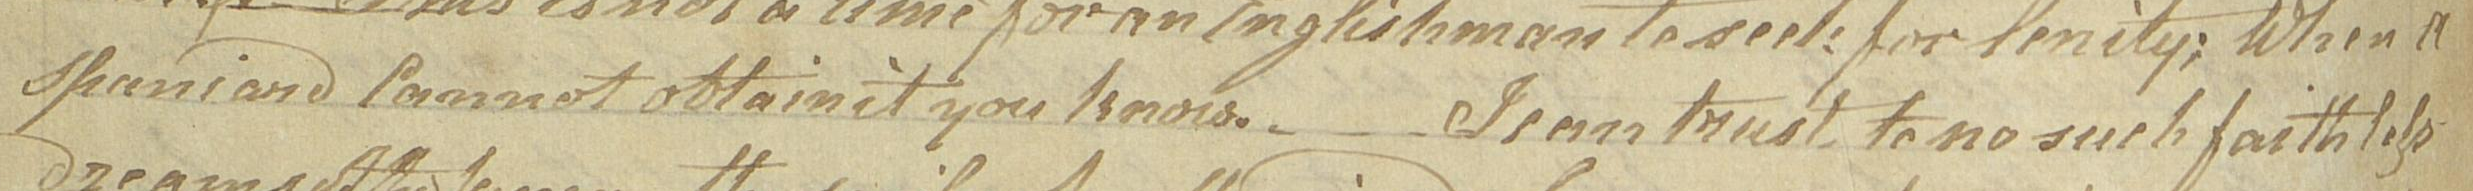Spraniard Cannot obtain it you know. I can trust to no such faithless
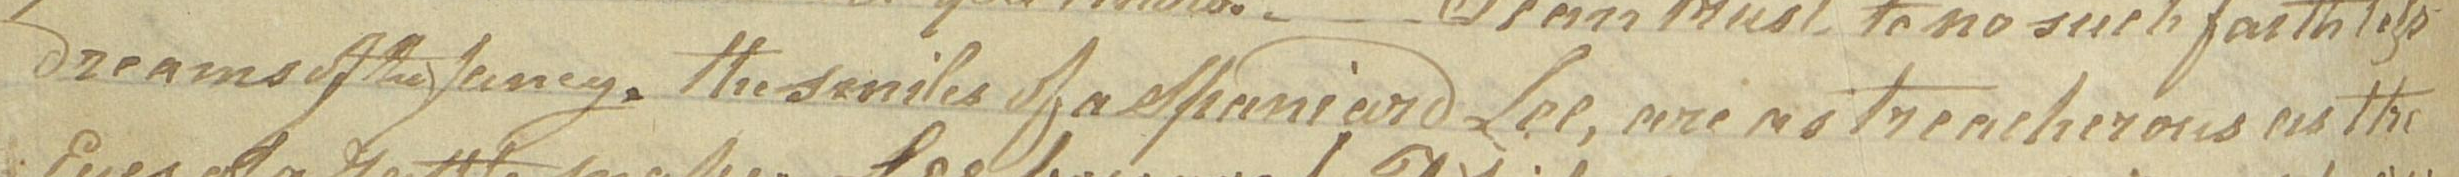dreams of the fancy. the smiles of Spaniard Lee, are so treacherous as the
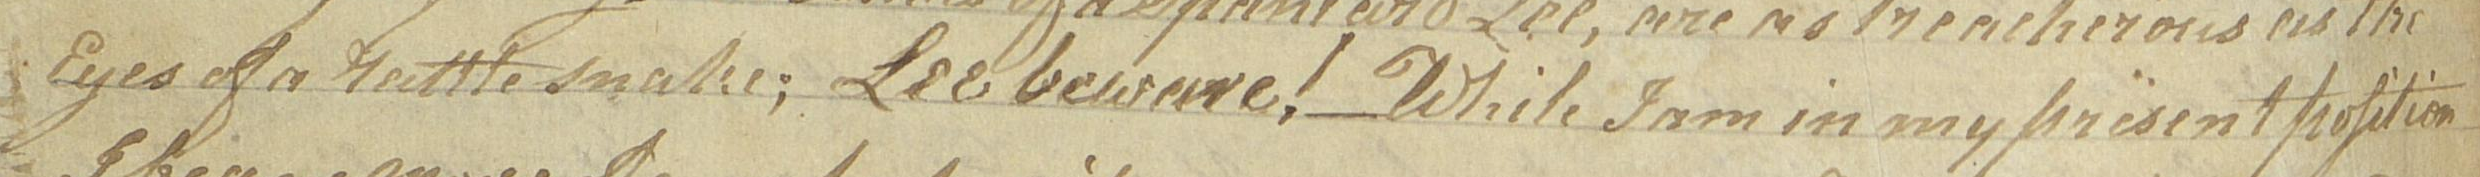Eyes of a rattle snake; Lee beware! While I am in my present position
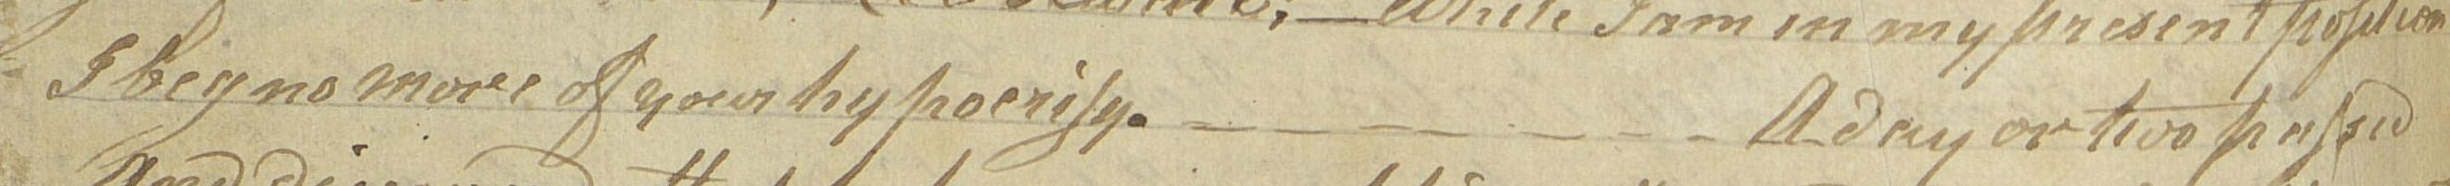I beg no more of your hypocrisy. A day or two passed
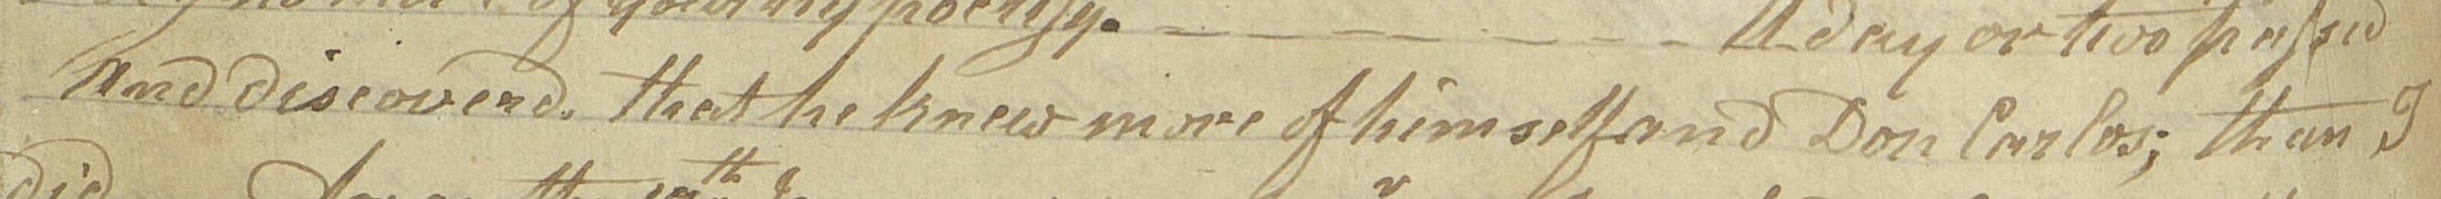and discoverd that he knew more of himself and Don Carlos; than I
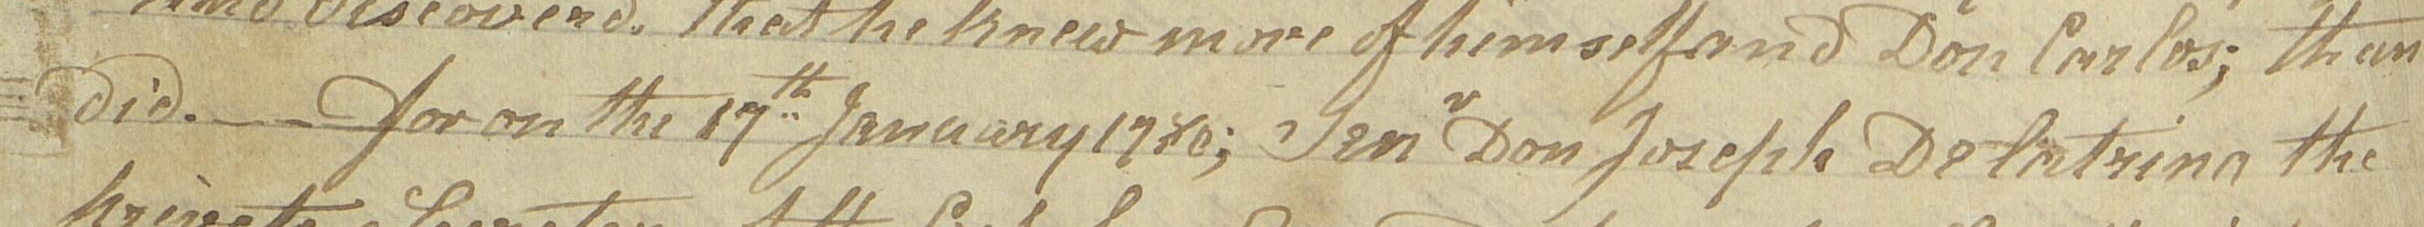did. for on the 17^th. January 1780; Sen^r. Don Joseph Delatrino the
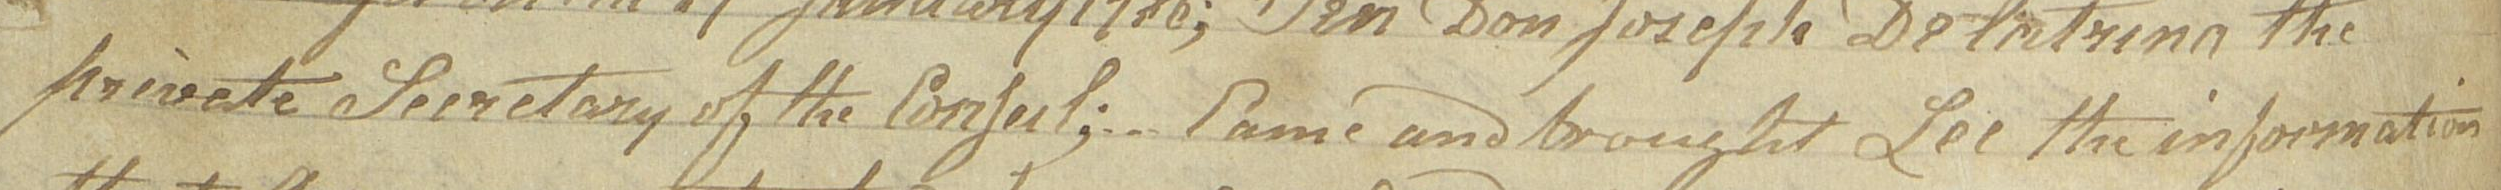private Secretary of the Consul; Came and brought Lee the information
